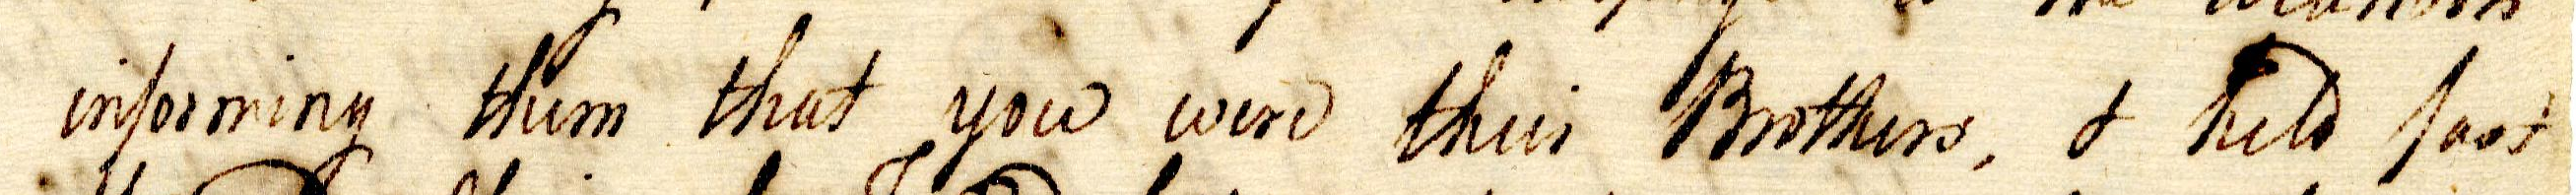informing them that you were their Brothers, & held fast
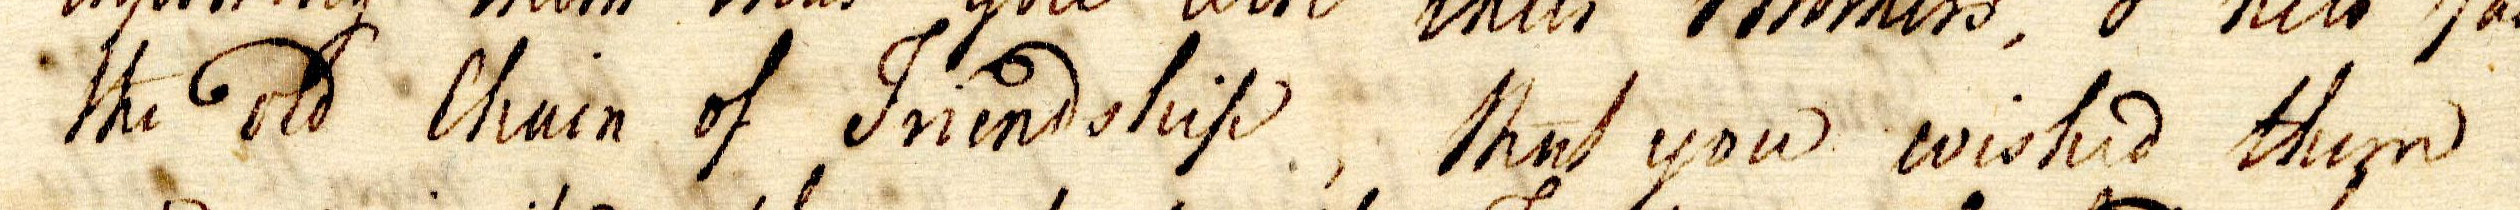the old Chain of Friendship that you wished them
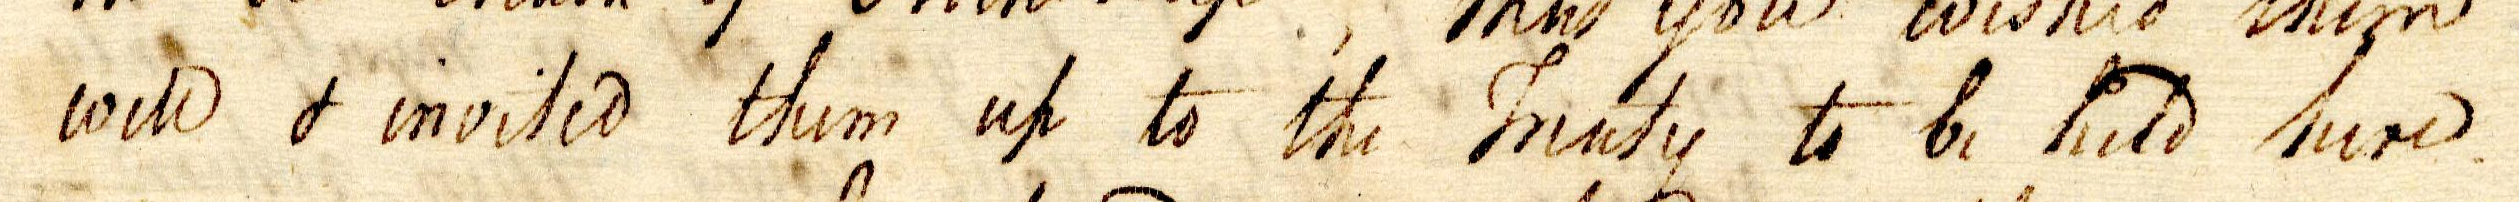well & invited them up to the Treaty to be held here
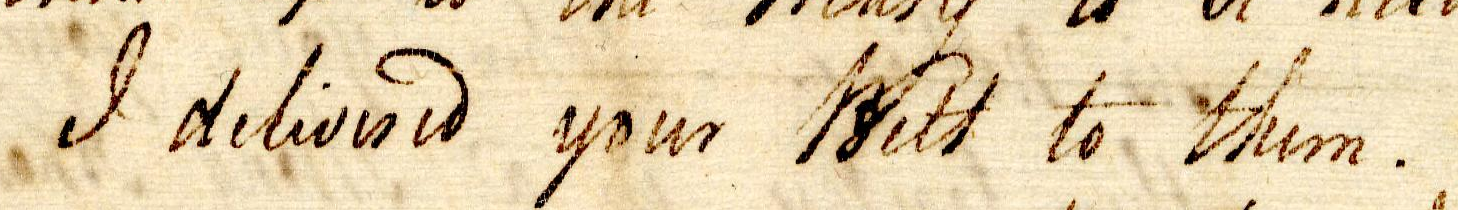I delivered your Belt to them.
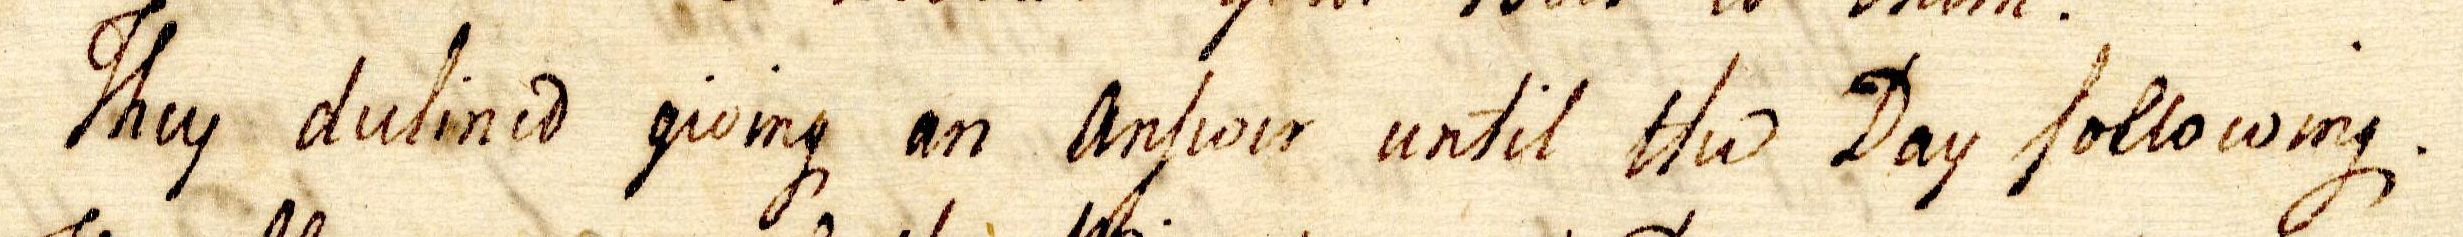They declined giving an Answer until the Day following.
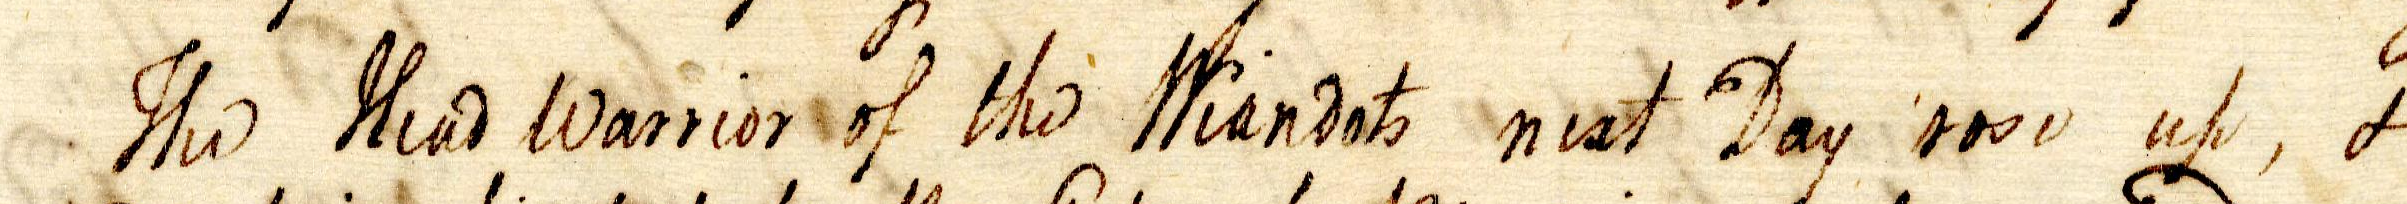The Head warrior of the Wiandots next Day rose up, &
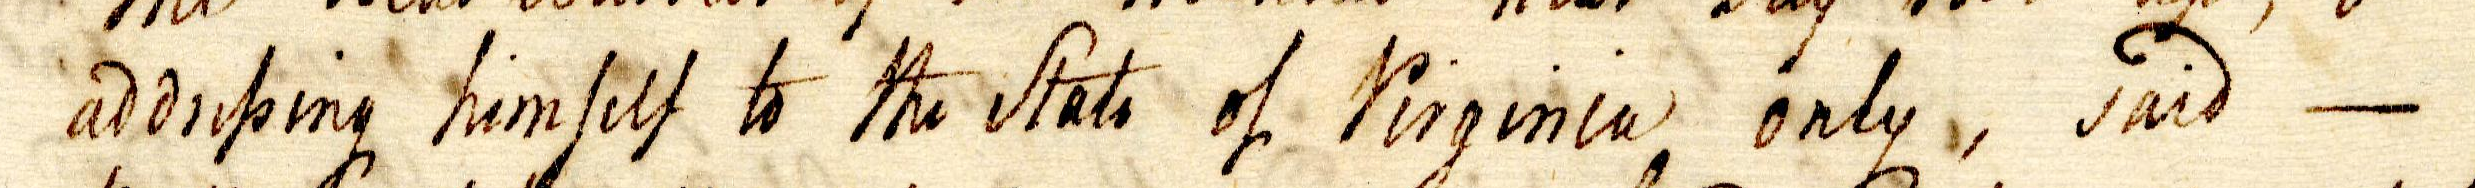addressing himself to the State of Virginia only, said-
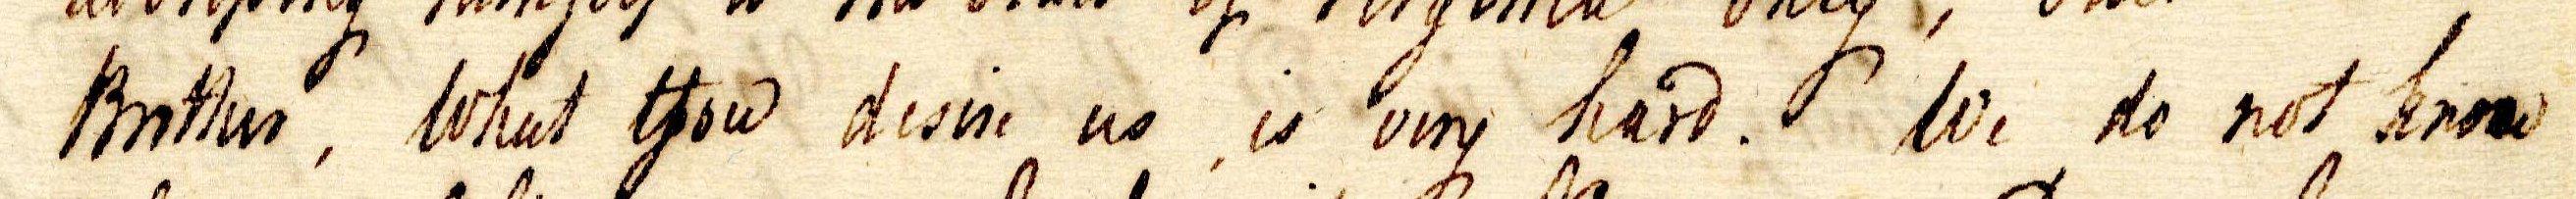Brother, what you desire us is very hard. We do not know
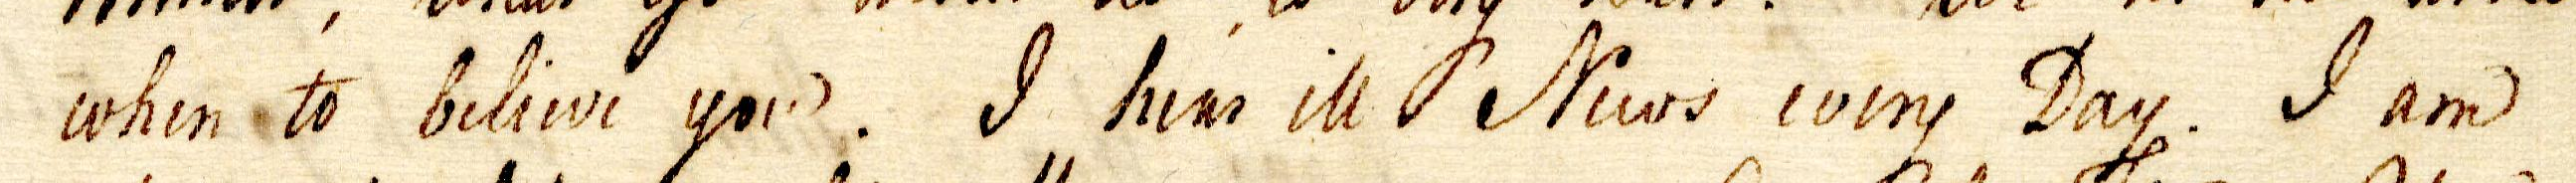when to believe you. I hear ill News every Day. I am
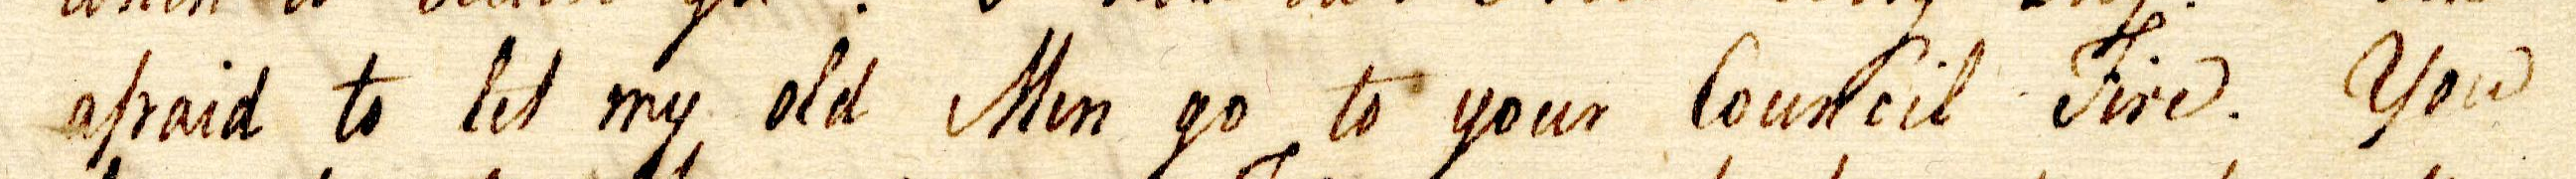afraid to let my old Men go to your Council Fire. You
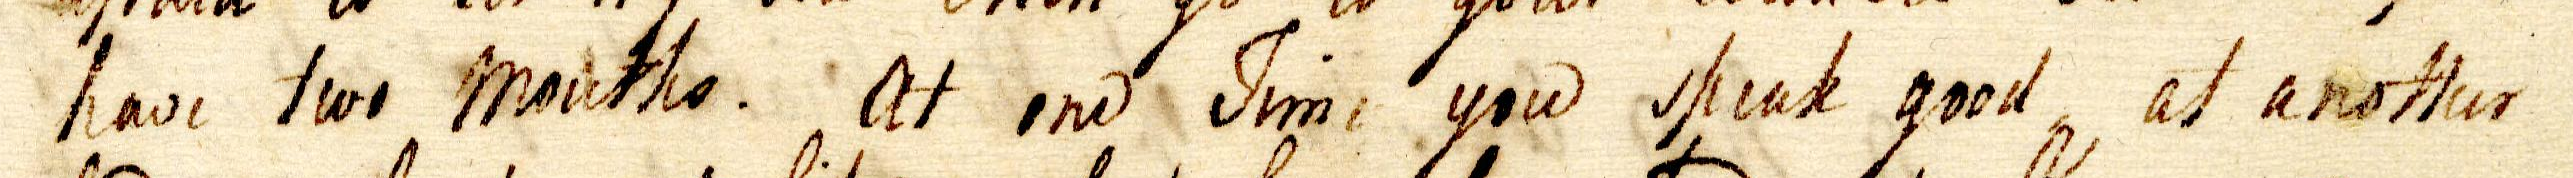have two mouths. At one Time you speak good, at another
